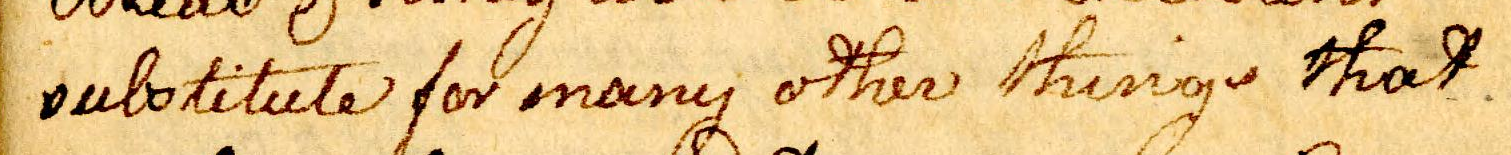substitute for many other things that
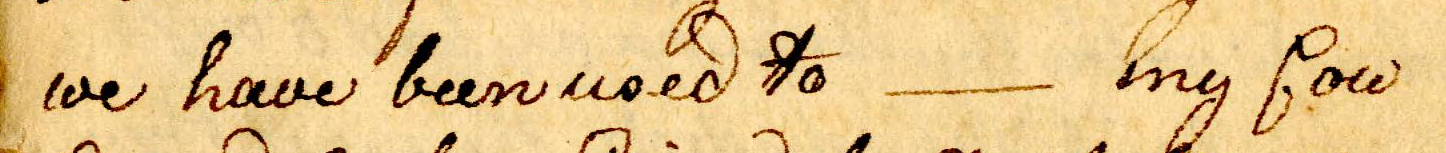we have been used to- my Cow
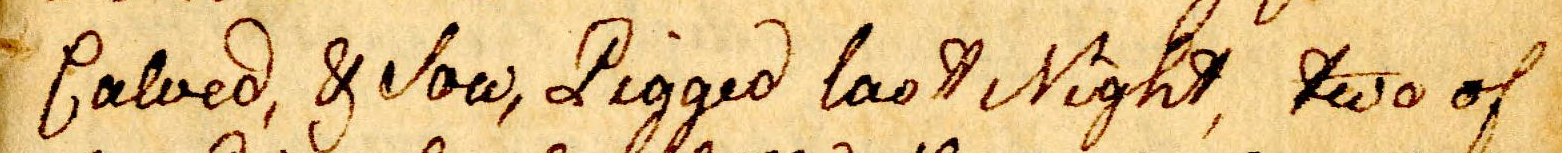Calved, & Sow, Pigged last Night, two of
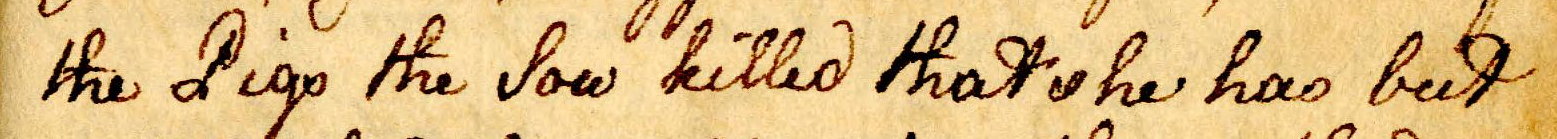the Pigs the Sow killed that she has but
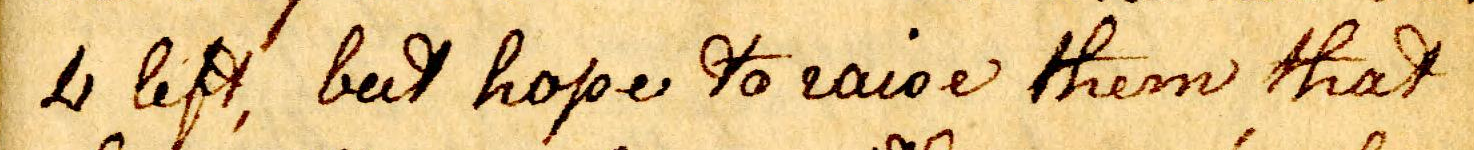4 left, but hope to raise them that
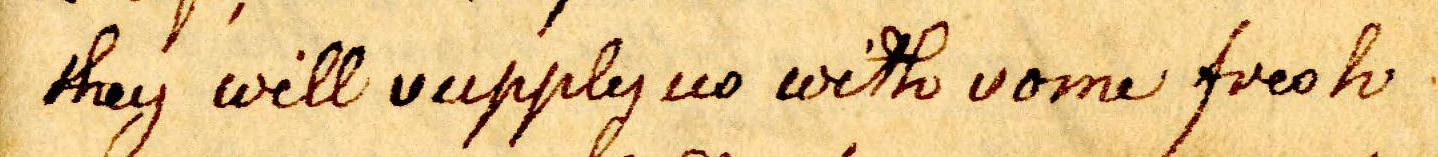they will supply us with some fresh
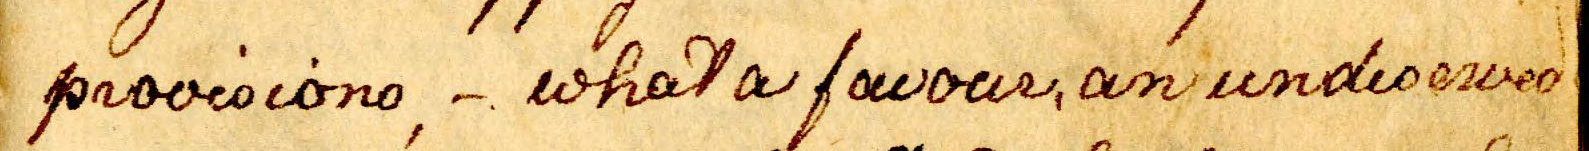provisions- what a favour, an undeserved
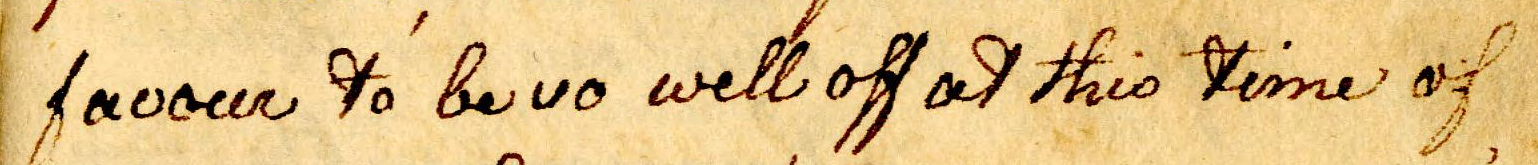favour to be so well off at this time of
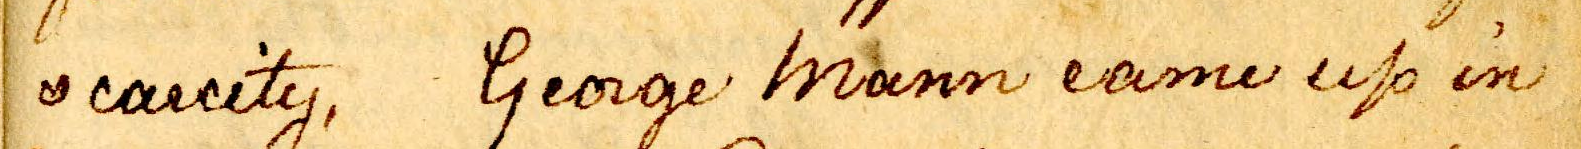scarcity. George Mann came up in
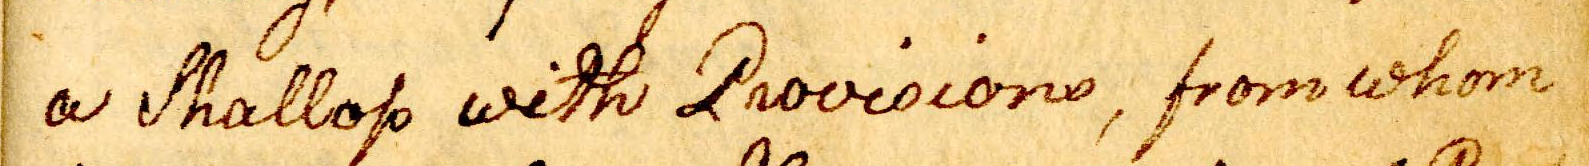a Shallop with Provisions, from whom
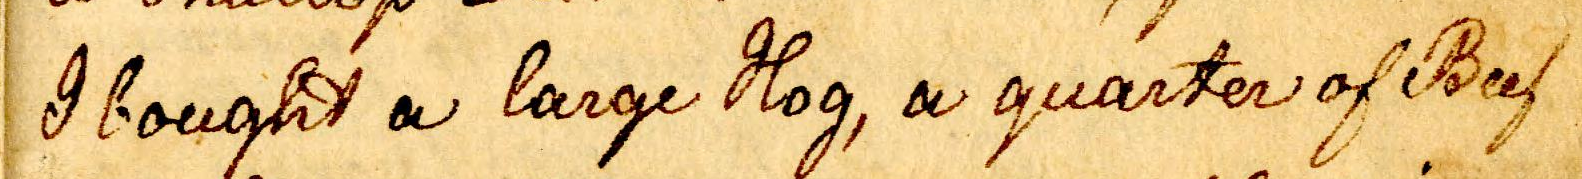I bought a large Hog, a quarter of Beef
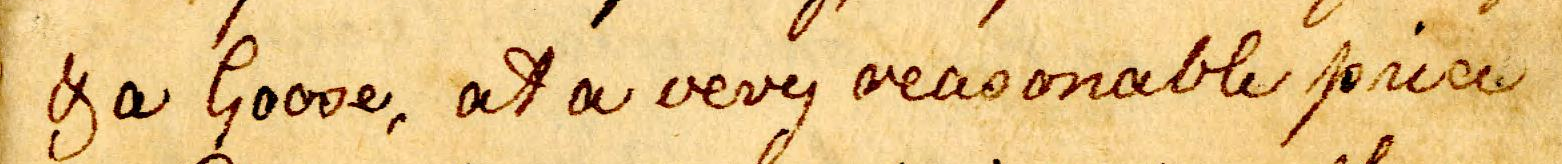& a Goose, at a very reasonable price
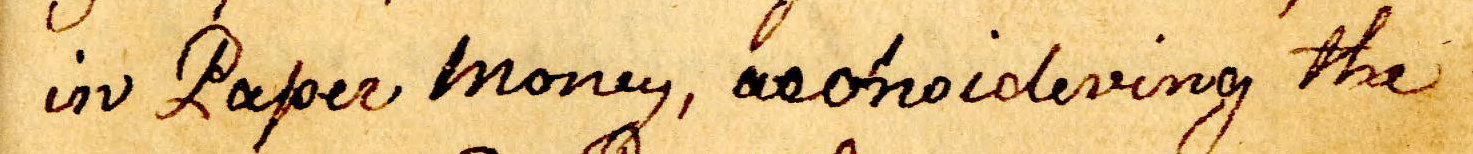in Paper money, aconsidering the
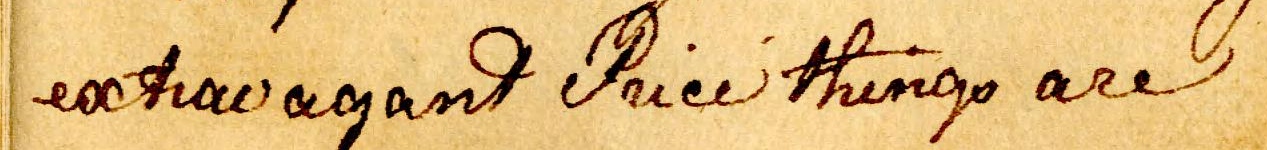extravagant Price things are
